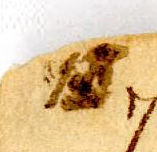70
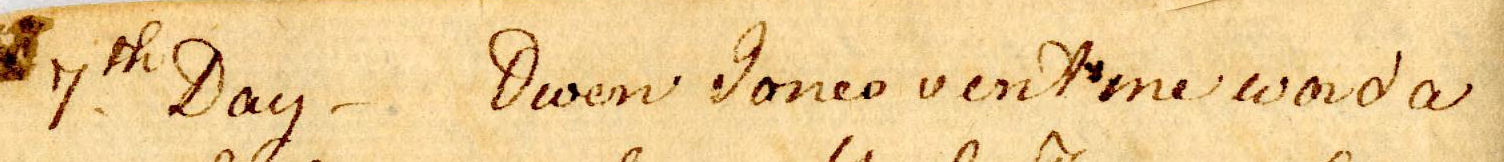7^th Day. Owen Jones sent me word a
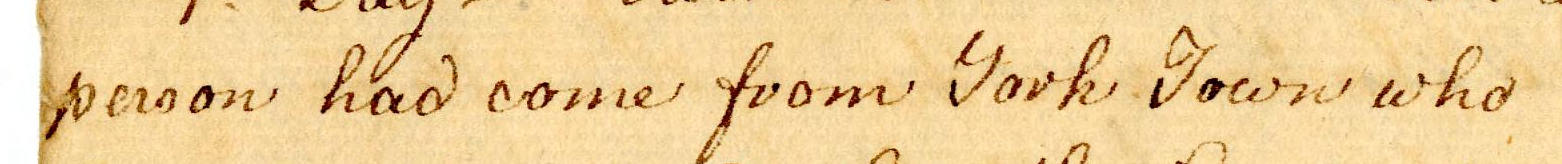person had come from York Town who
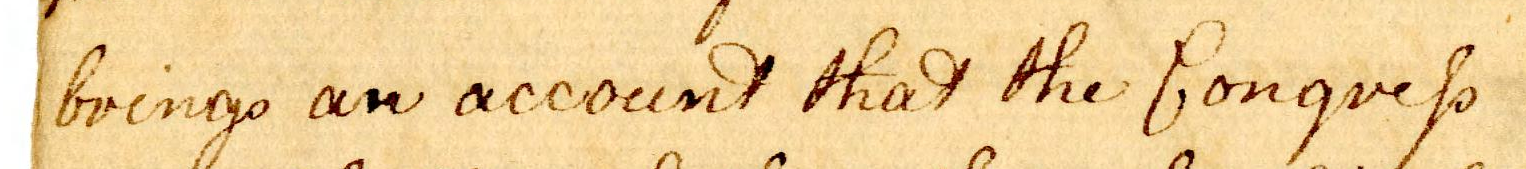brings an account that the Congress
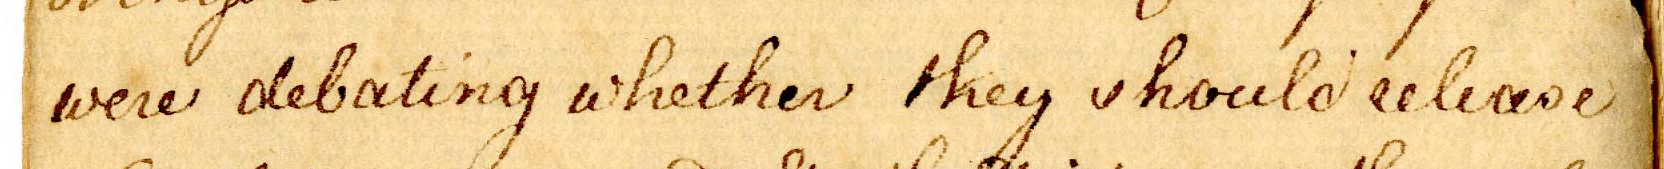were debating whether they should release
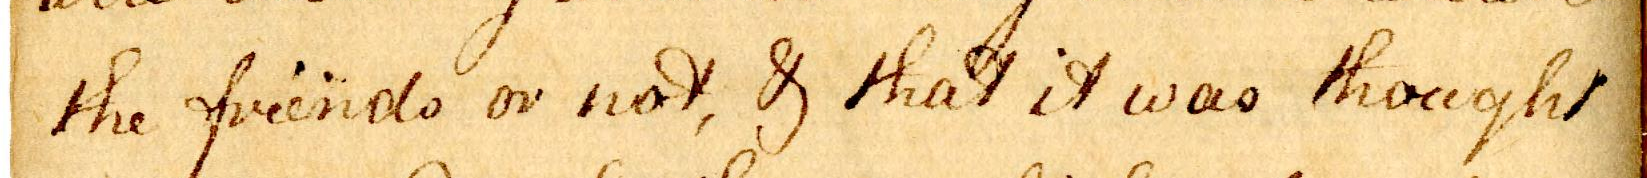the friends or not, & that it was thought
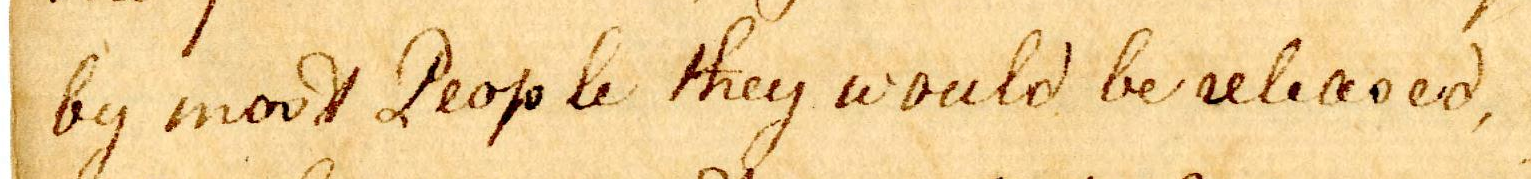by most People they would be released,
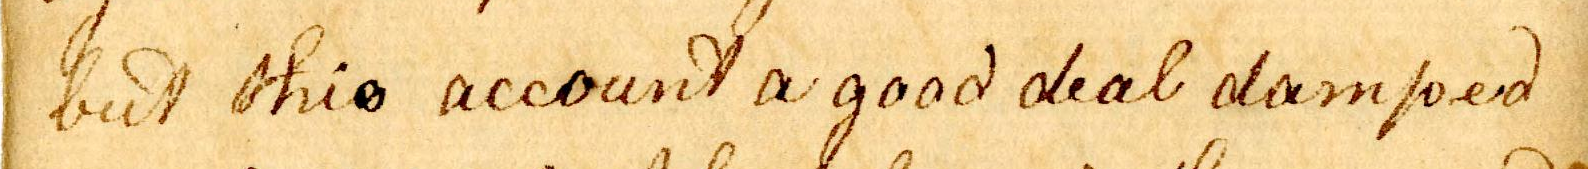but this account a good deal damped
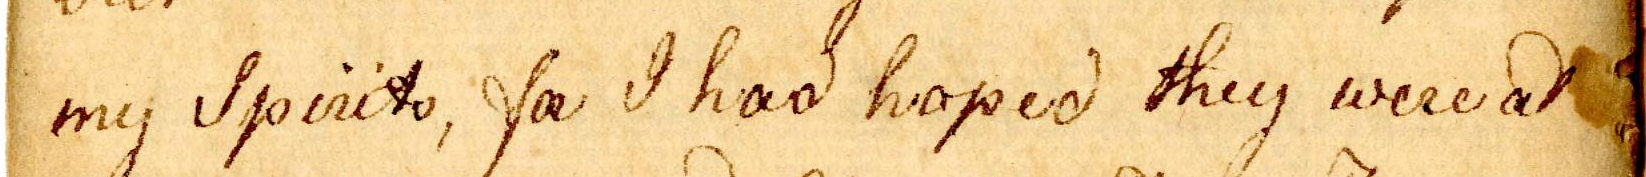my Spirits, for I had hoped they were at
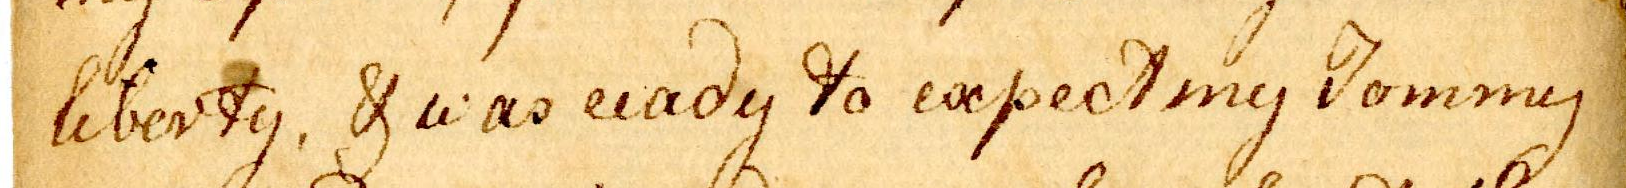liberty, & was ready to expect my Tommy
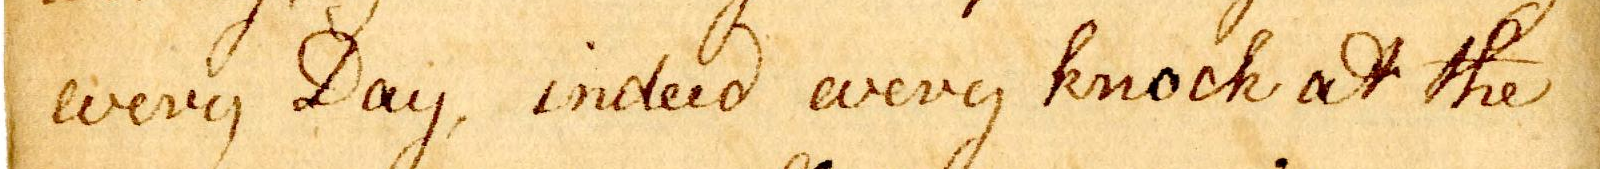every Day, indeed every knock at the
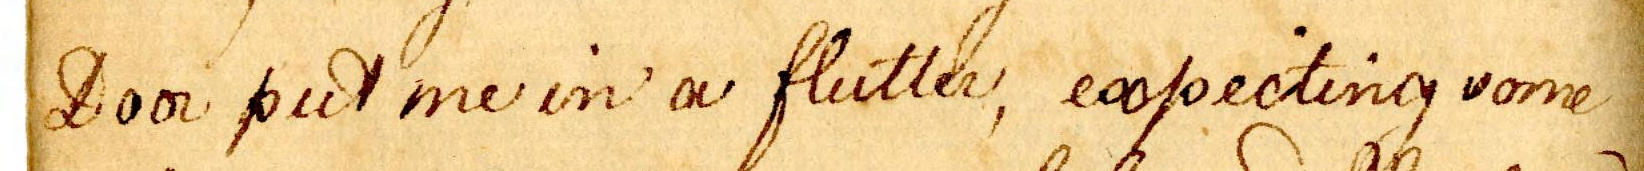Door put me in a flutter, expecting some
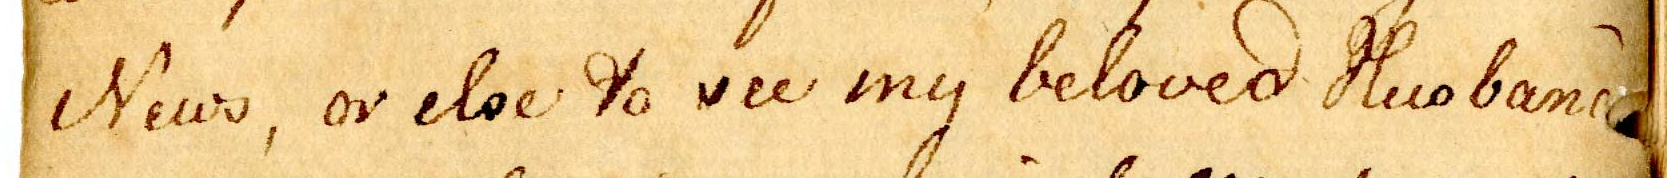News, or else to see my beloved Husband
